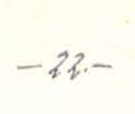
22.
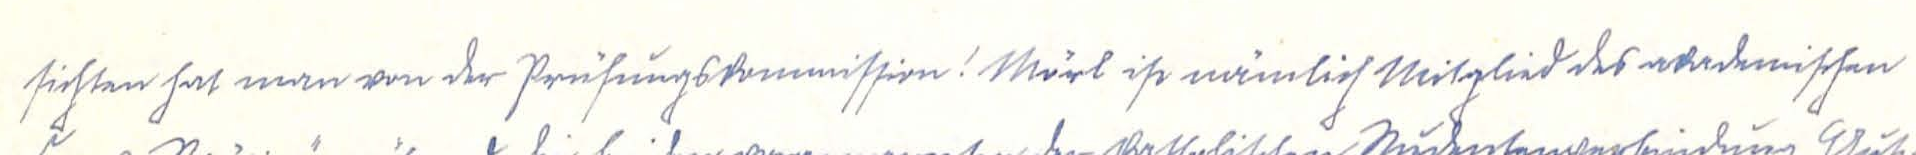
sichten hat man von der Prüfungskommission! Mörl ist nämlich Mitglied des akademischen
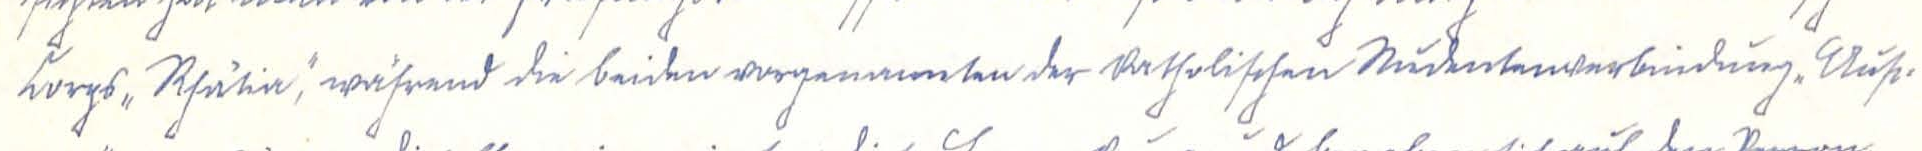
Corps "Rhätia" während die beiden vorgenannten der katholischen Studentenverbindung „Aust-
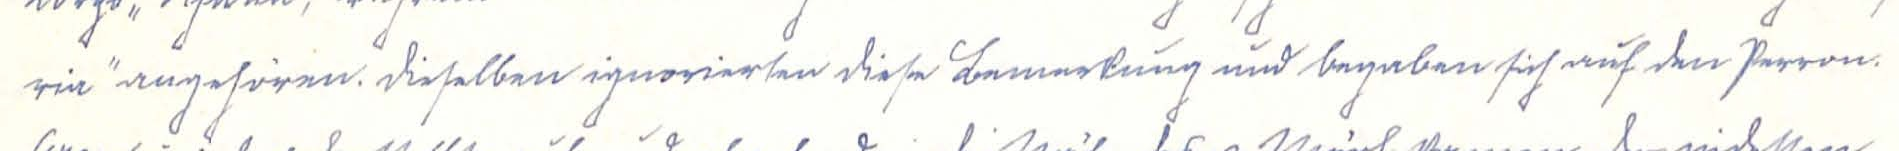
ria“ angehören. Dieselben ignorierten diese Bemerkung und begaben sich auf den Perron.
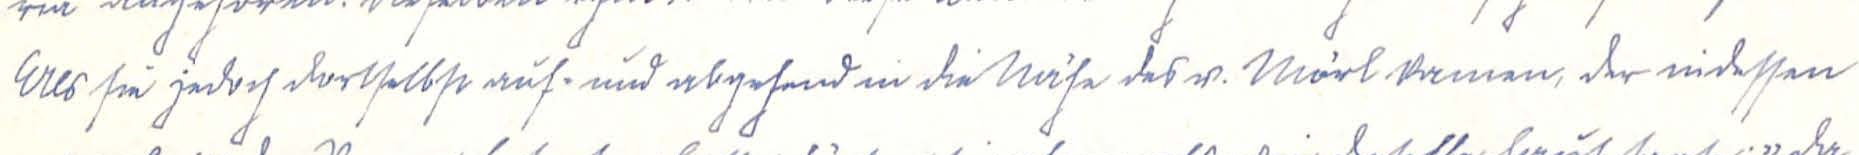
Als sie jedoch dortselbst auf- und abgehend in die Nähe des v. Mörl kamen, der indessen
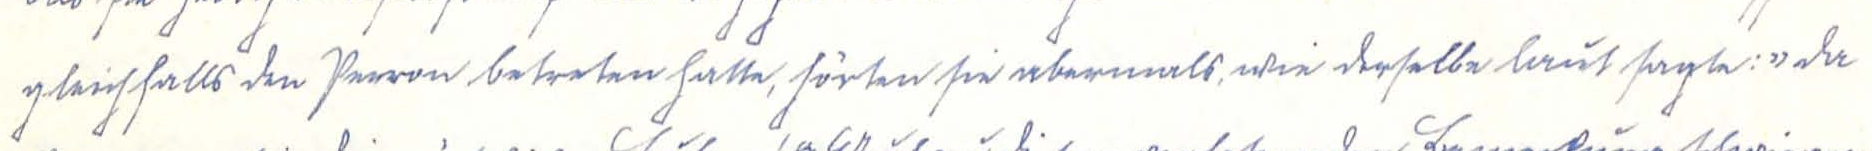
gleichfalls den Perron betreten hatte, hörten sie abermals, wie derselbe laut sagte: "Da
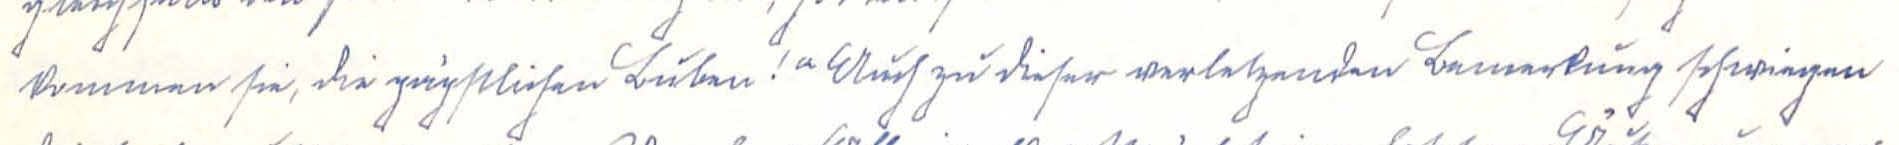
kommen sie, die päpstlichen Buben!" Auch zu dieser verletzenden Bemerkung schwiegen
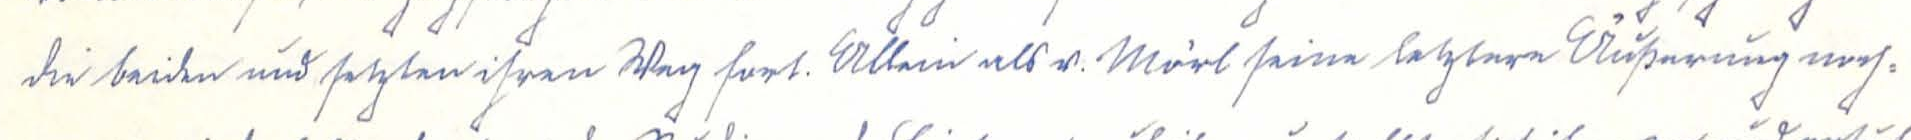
die beiden und setzten ihren Weg fort. Allein als v. Mörl seine letztere Äußerung noch-
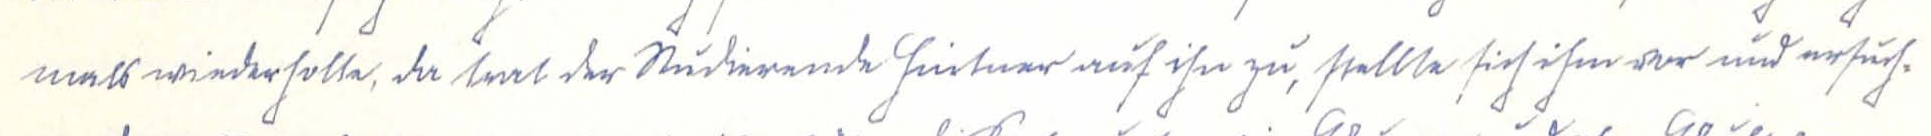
mals wiederholte, da trat der Studierende Hintner auf ihn zu, stellte sich ihm vor und ersuch-
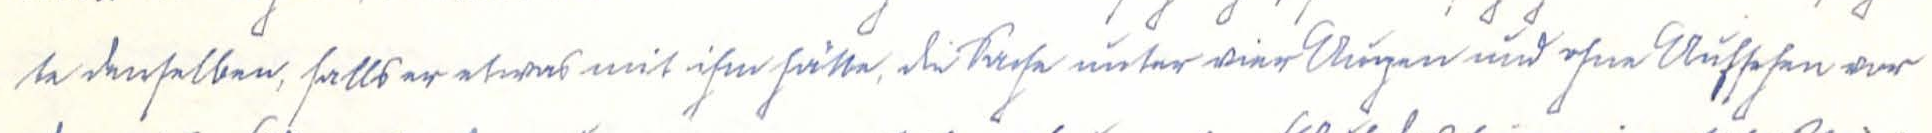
te denselben, falls er etwas mit ihm hätte, die Sache unter vier Augen und ohne Aufsehen vor
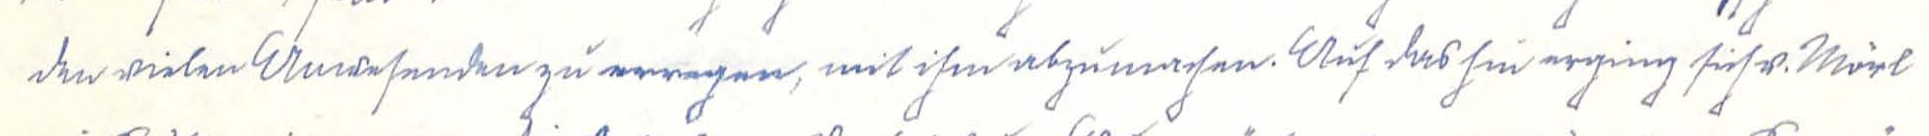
den vielen Anwesenden zu erregen, mit ihm abzumachen. Auf das hin erging sich v. Mörl
